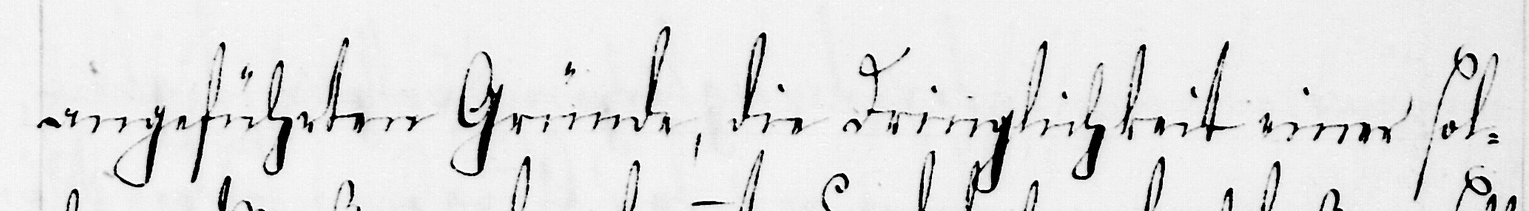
angeführten Gründe, die Dringlichkeit einer sol¬
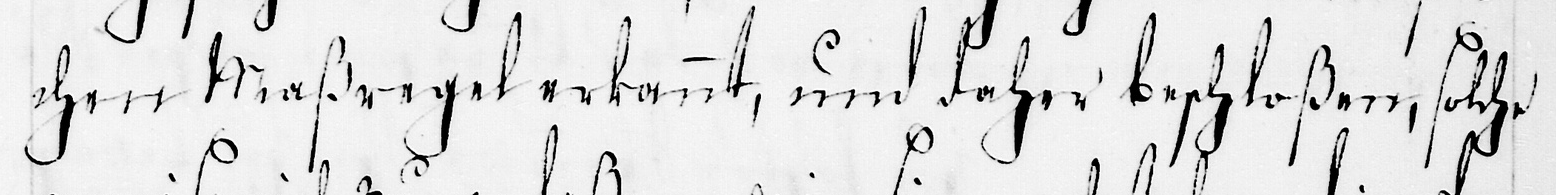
chen Maßregel erkannt, und daher beschloßen, solche
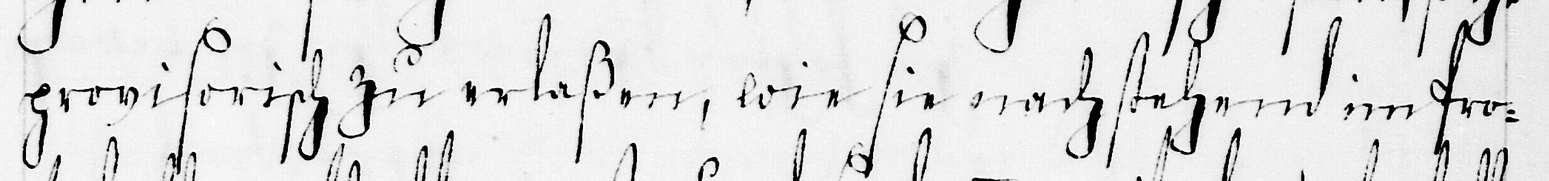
provisorisch zu erlaßen, wie sie nachstehend im Pro¬
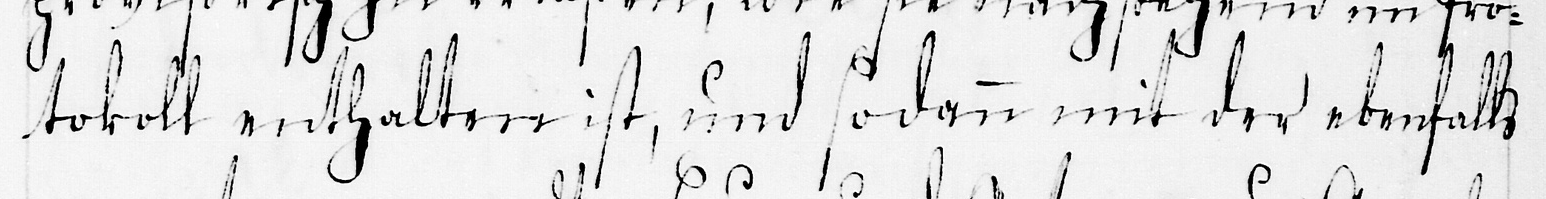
tokoll enthalten ist, und sodann mit der ebenfalls
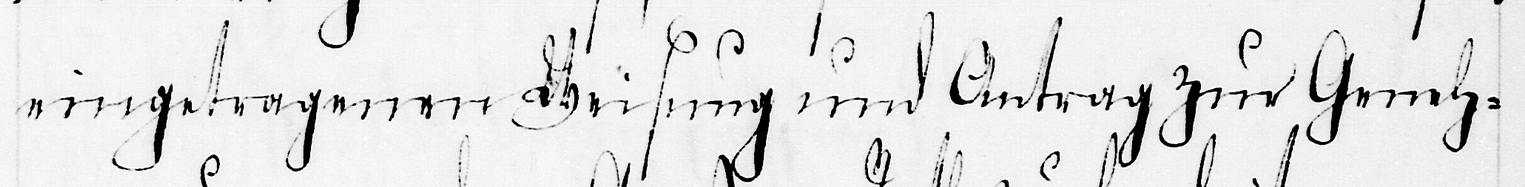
eingetragenen Weisung und Antrag zur Geneh¬
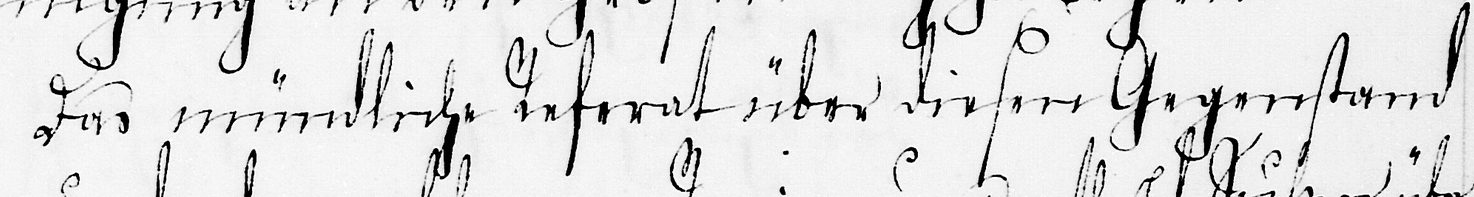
Das mündliche Referat über diesen Gegenstand
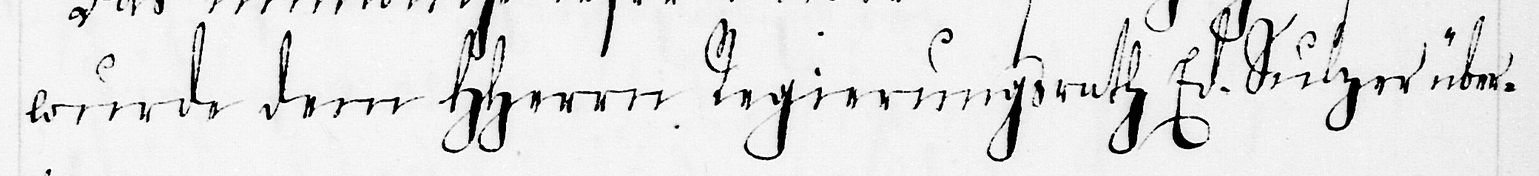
wurde dem HHerrn Regierungsrath Ed. Sulzer über¬
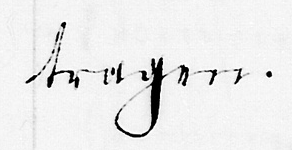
tragen.
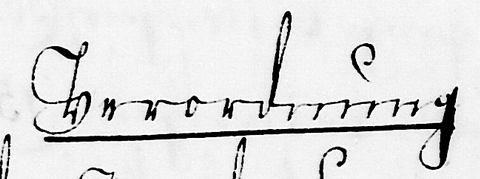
Verordnung
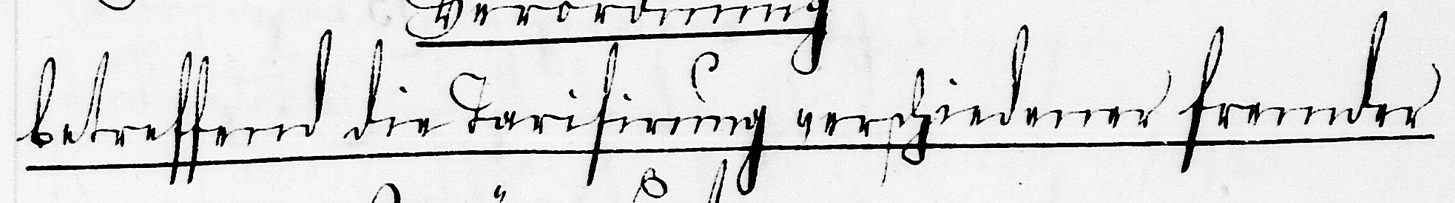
betreffend die Tarifirung verschiedener fremder
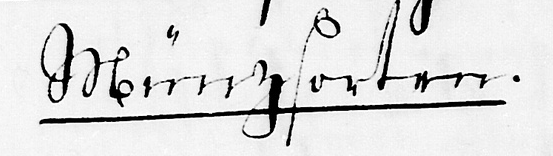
Münzsorten
